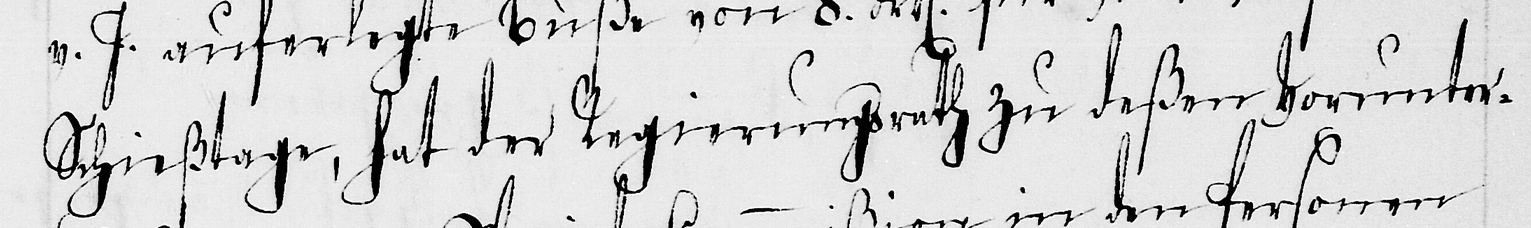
Schießtage, hat der Regierungsrath zu deßen Vorunter¬
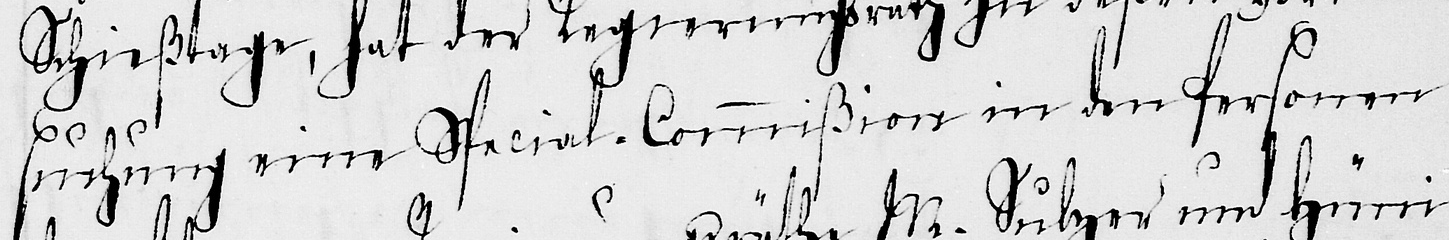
suchung eine Special-Commißion in den Personen
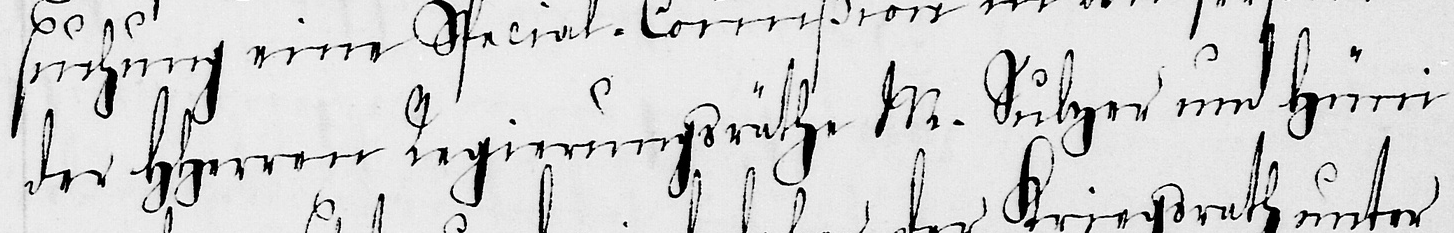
der HHerren Regierungsräthe M. Sulzer und Hüni
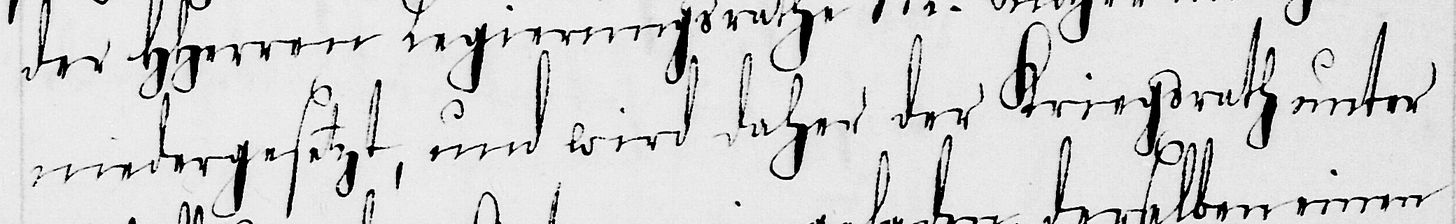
niedergesetzt, und wird daher der Kriegsrath unter
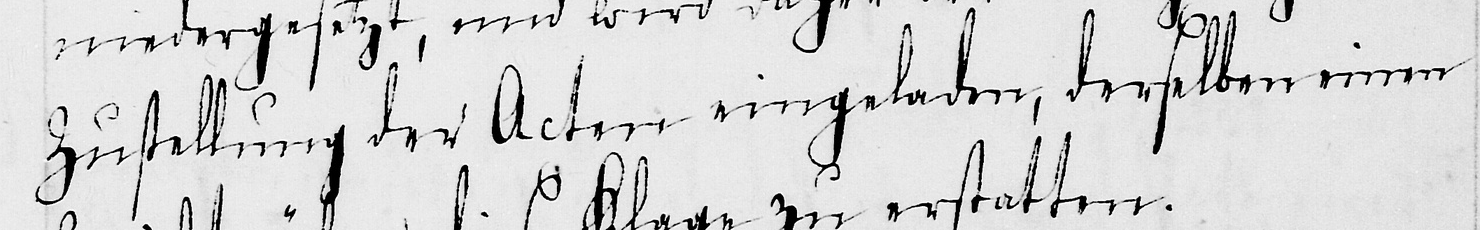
Zustellung der Acten eingeladen, derselben einen
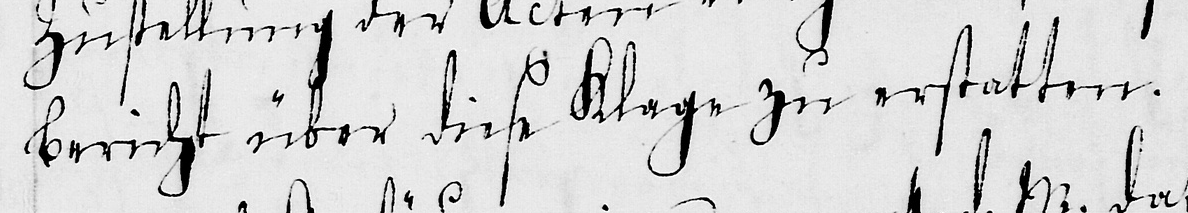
Bericht über diese Klage zu erstatten.
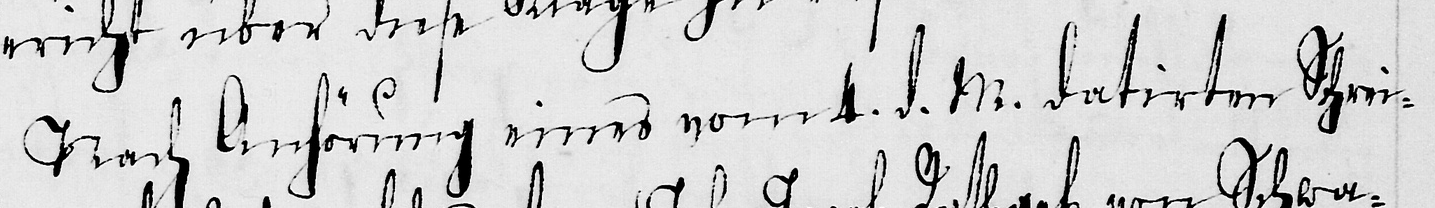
Nach Anhörung eines vom 4. d. M. datirten Schrei¬
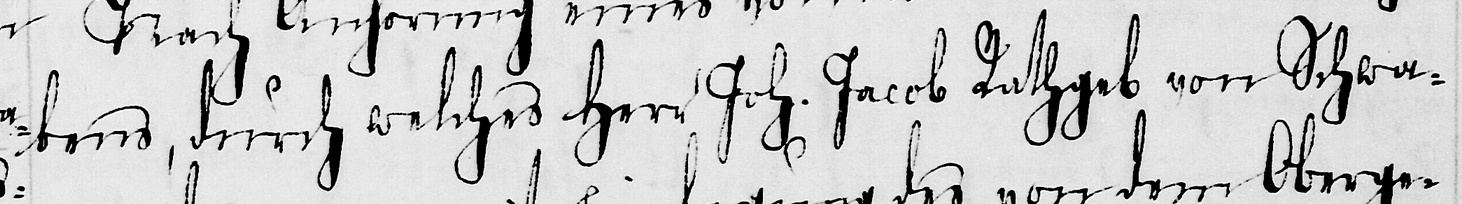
bens, durch welches Herr Joh. Jacob Rathgeb von Schwa¬
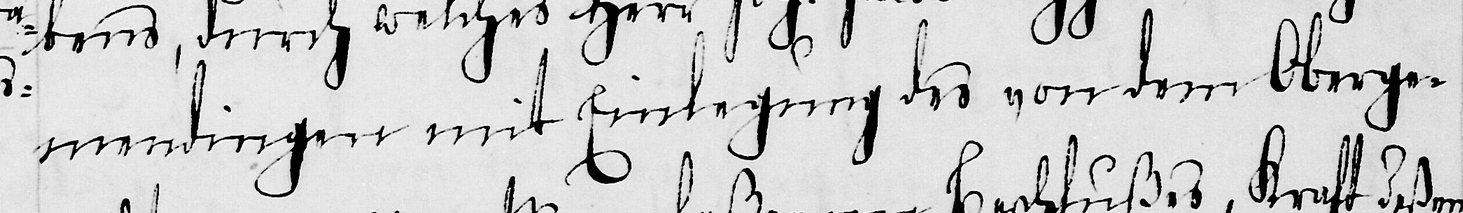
mendingen mit Einlegung des von dem Oberge¬
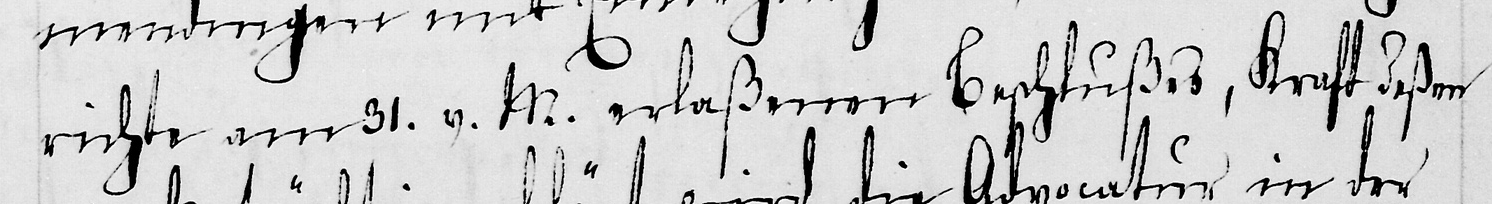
richte am 31. v. M. erlaßenen Beschlußes, Kraft deßen
